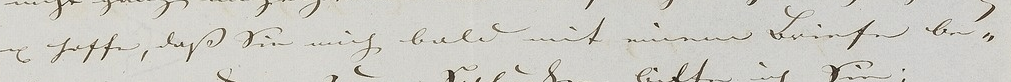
& hoffe, daß Sie mich bald mit einem Briefe be-
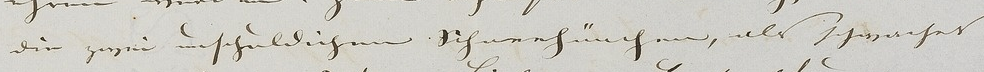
die zwei unschuldigen Schneehünchen, als schwaches
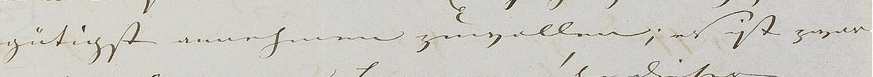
gütigst annehmen zuwollen; es ist zwar
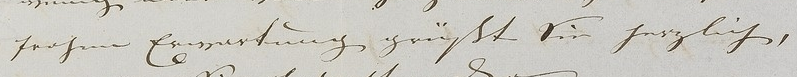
frohen Erwartung grüßt Sie herzlich,
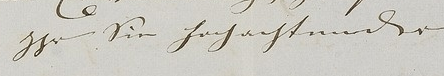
Ihr Sie hochachtender
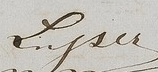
Lusser
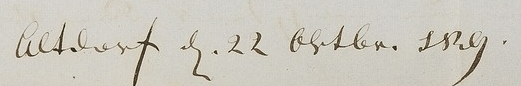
Altdorf d. 22 Oktbr. 1849.
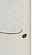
von Hr.
